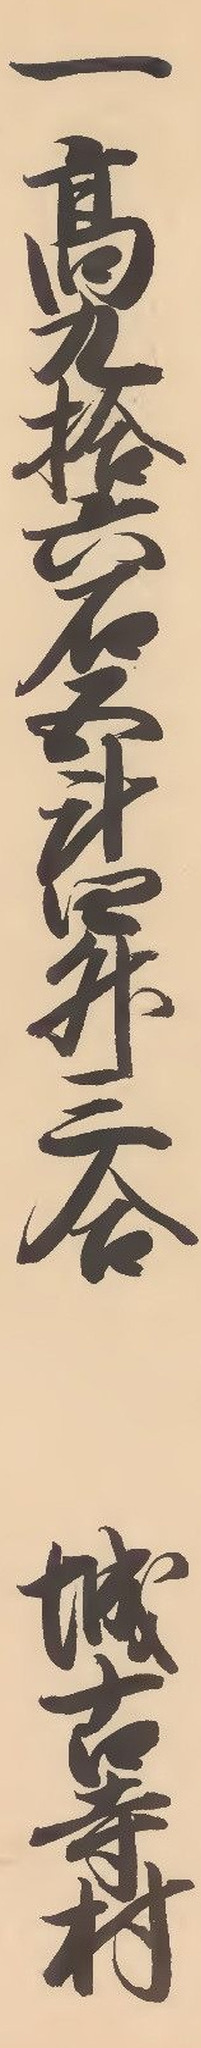一高九拾六石五斗四升三合城古寺村
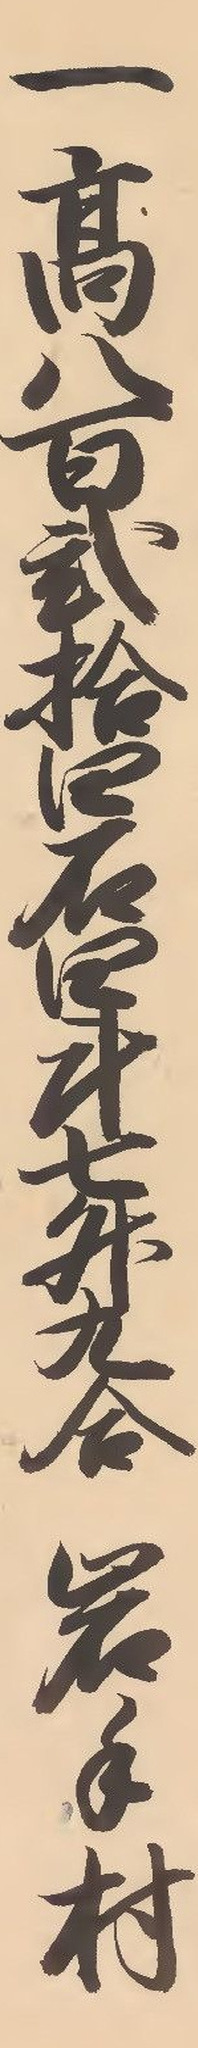一高八百弐拾四石四斗七升九合岩手村
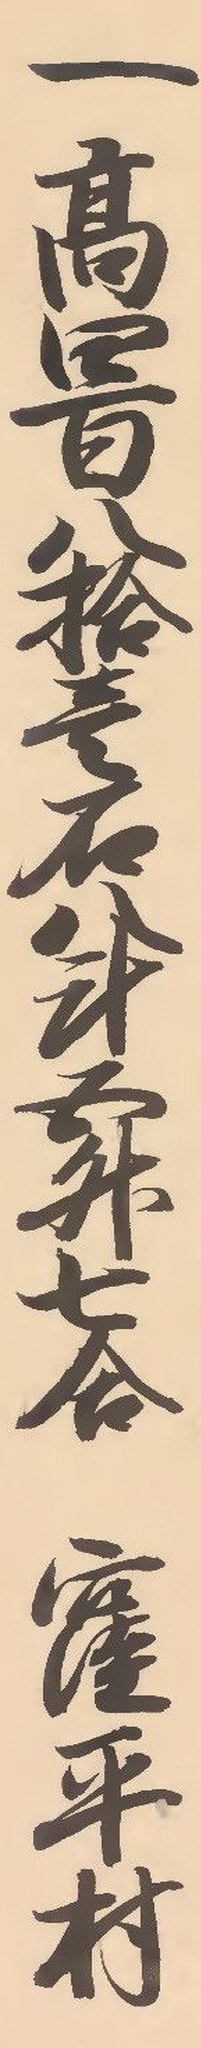一高四百八拾壱石八斗五升七合窪平村
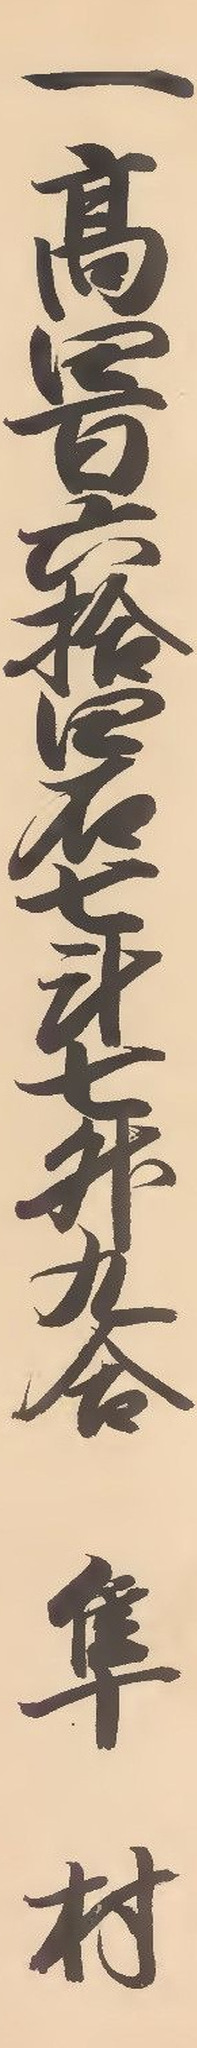一高四百六拾四石七斗七升九合隼村
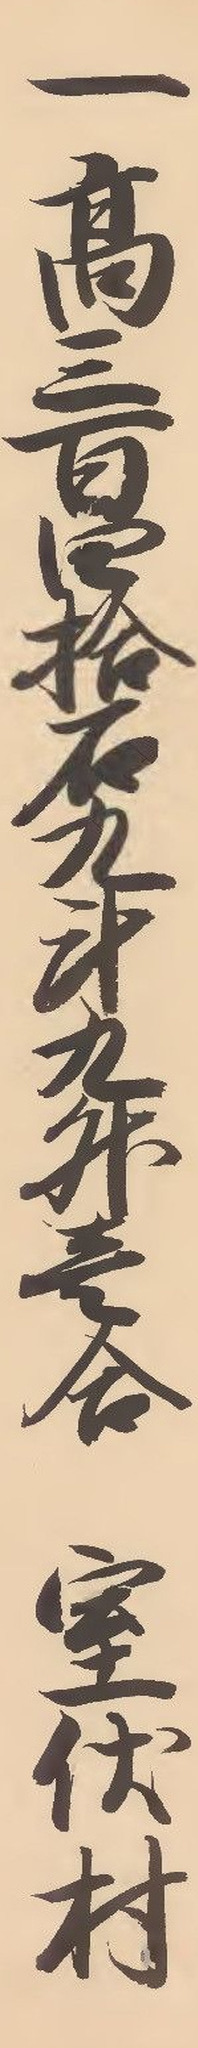一高三百四拾石九斗九升壱合室伏村
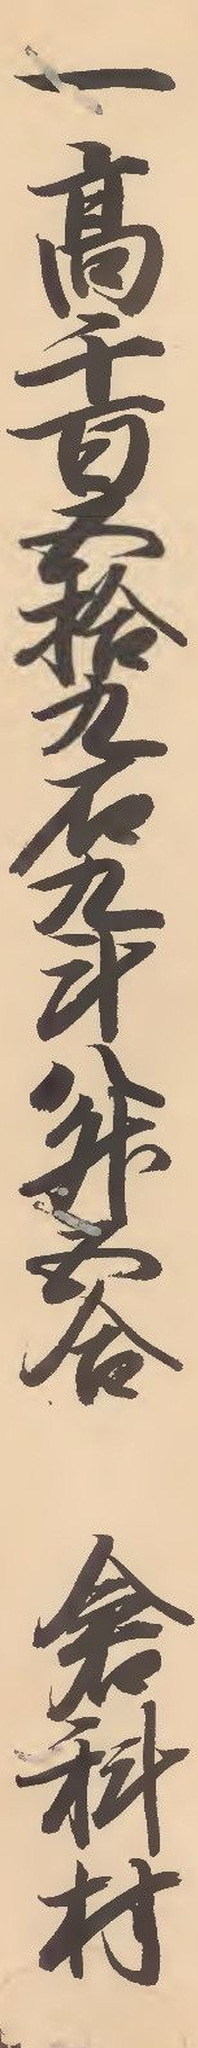一高千百五拾九石九斗八升五合倉科村

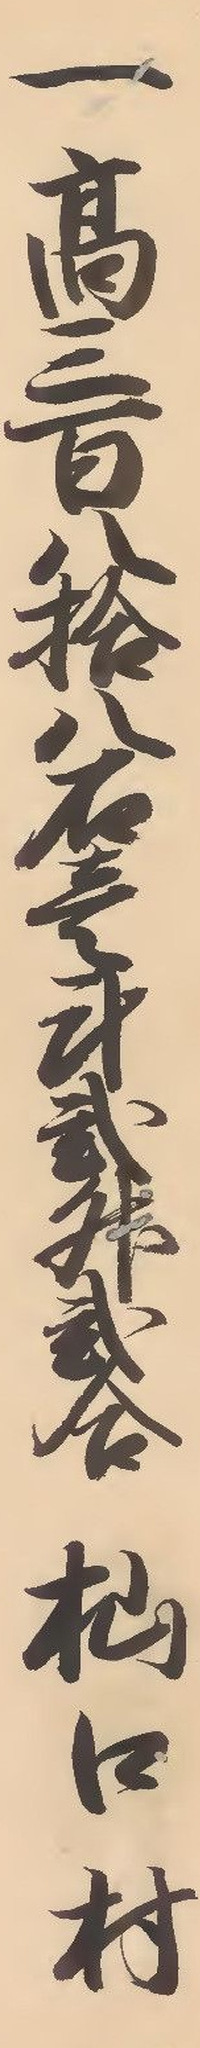一高三百八拾八石壱斗弐升弐合杣口村
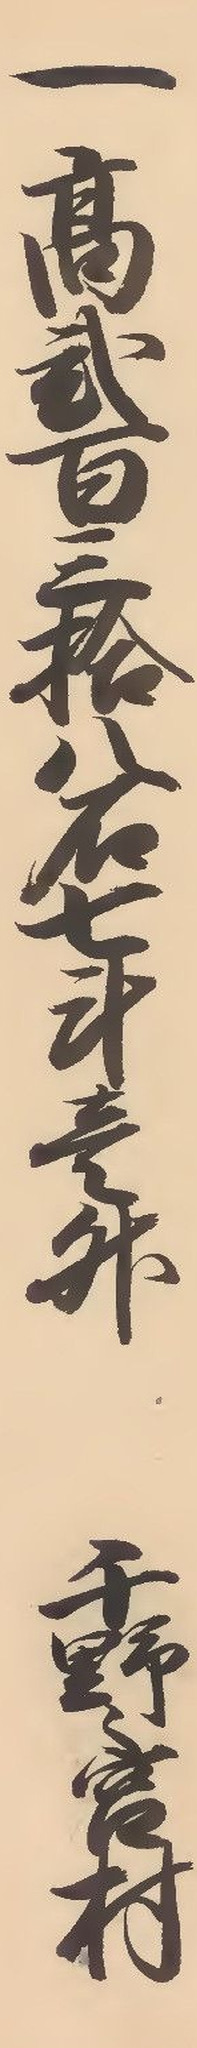一高弐百三拾八石七斗壱升千野々宮村
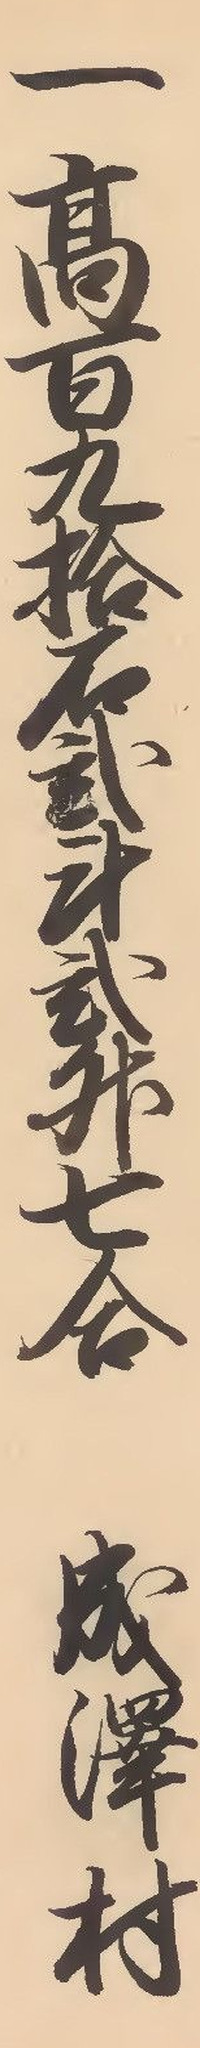一高百九拾石弐斗弐升七合成沢村
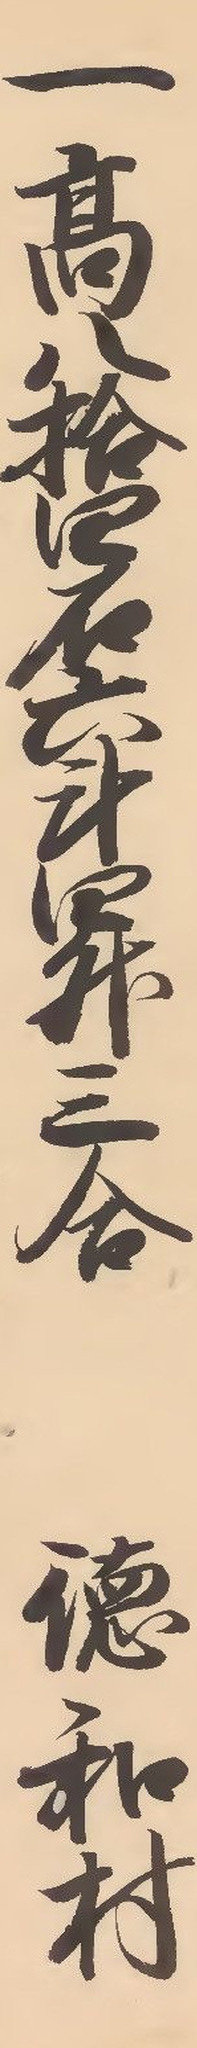一高八拾四石六斗四升三合徳和村
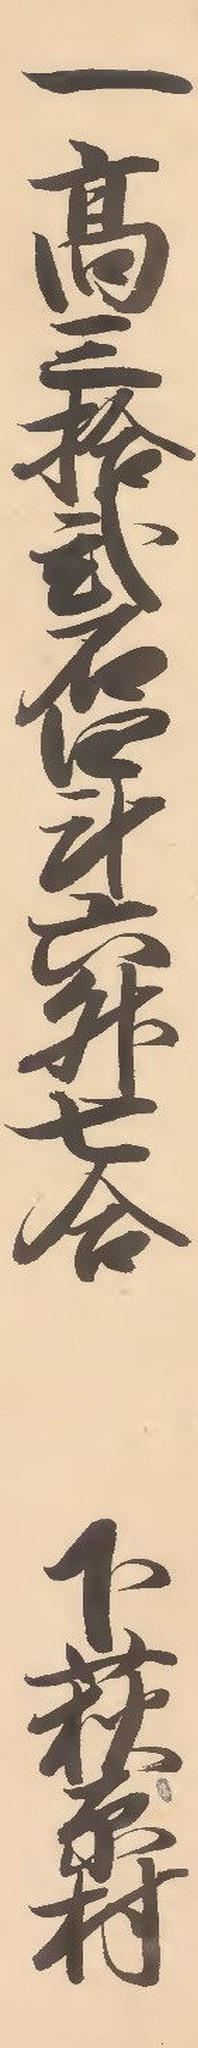一高三拾弐石四斗六升七合下萩原村
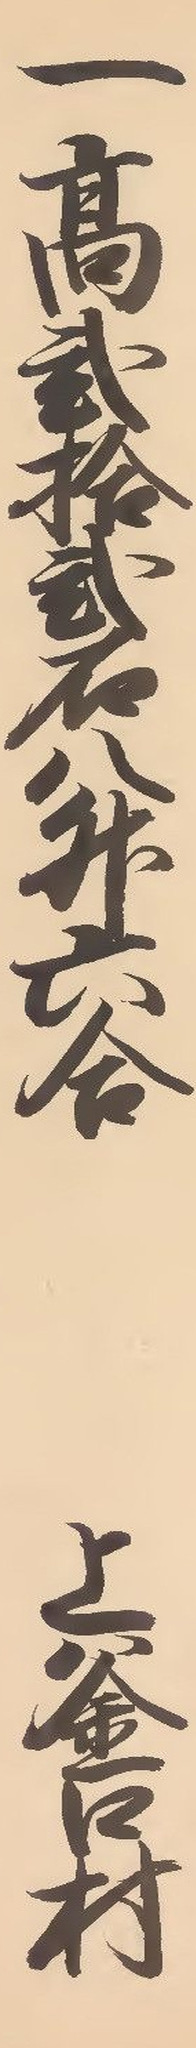一高弐拾弐石八升六合上釜口村
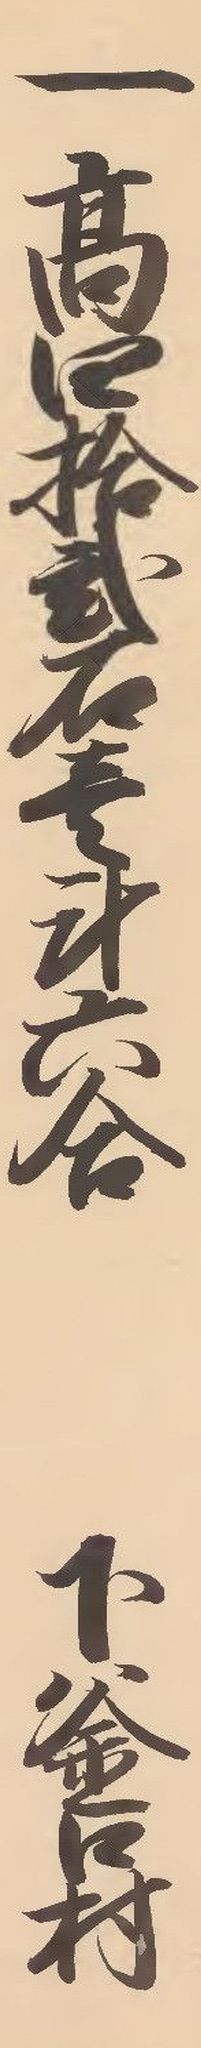一高四拾弐石壱斗六合下釜口村
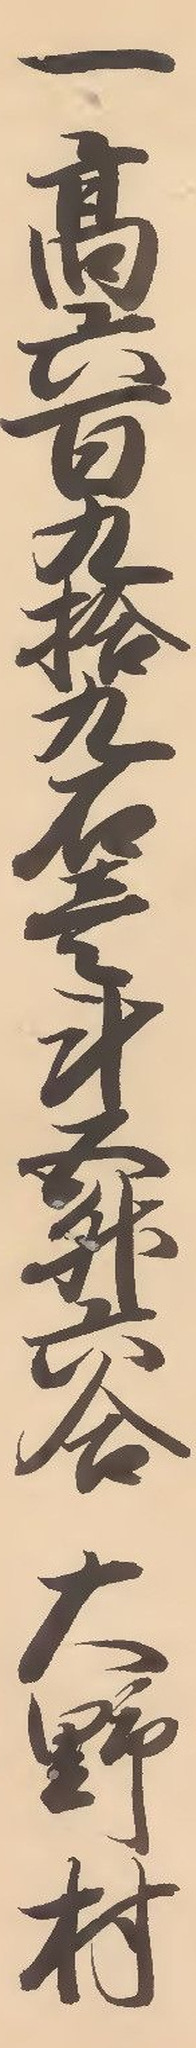一高六百九拾九石壱斗五升六合大野村

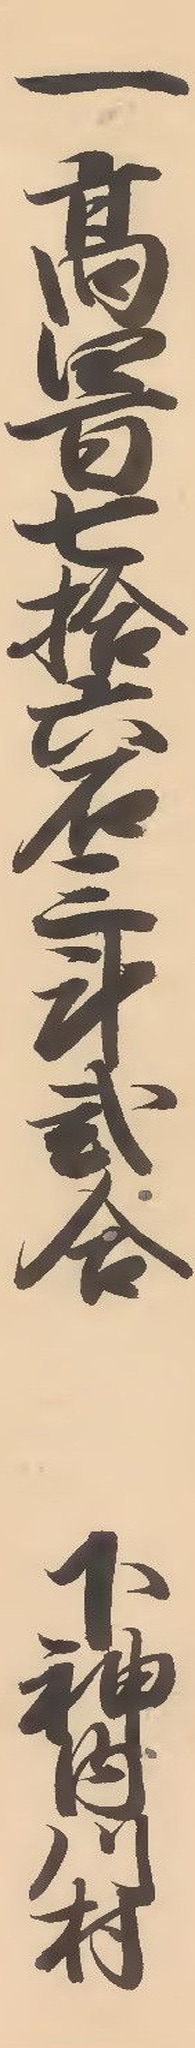一高四百七拾六石三斗弐合下神内川村
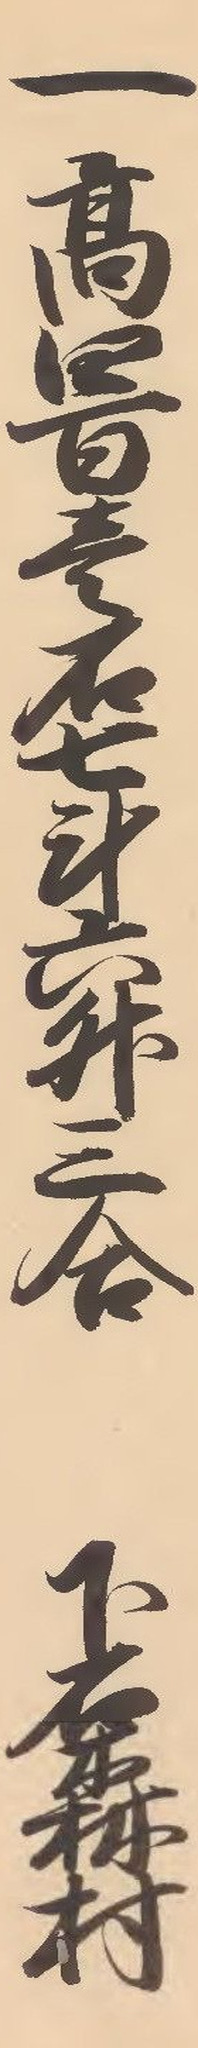一高四百壱石七斗六升三合下石森村
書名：甲斐国郷帳
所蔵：国立公文書館 National Archives of Japan
